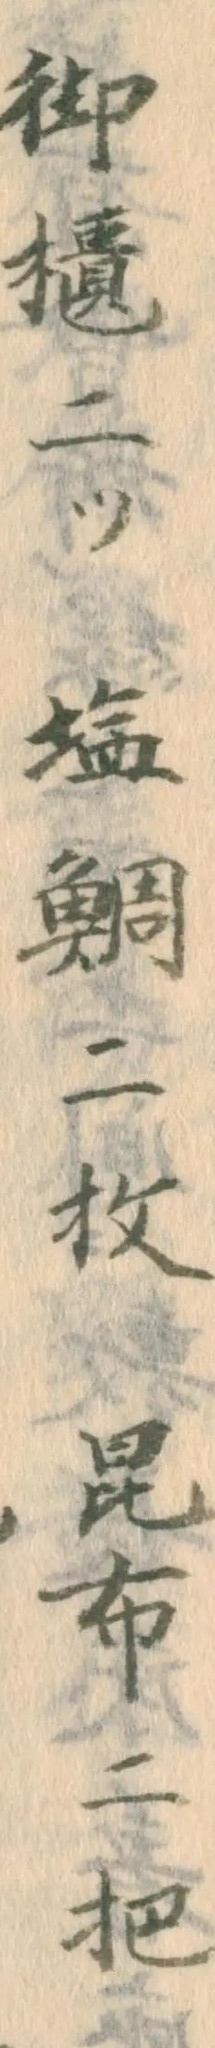御櫃二ツ塩鯛二枚昆布二把
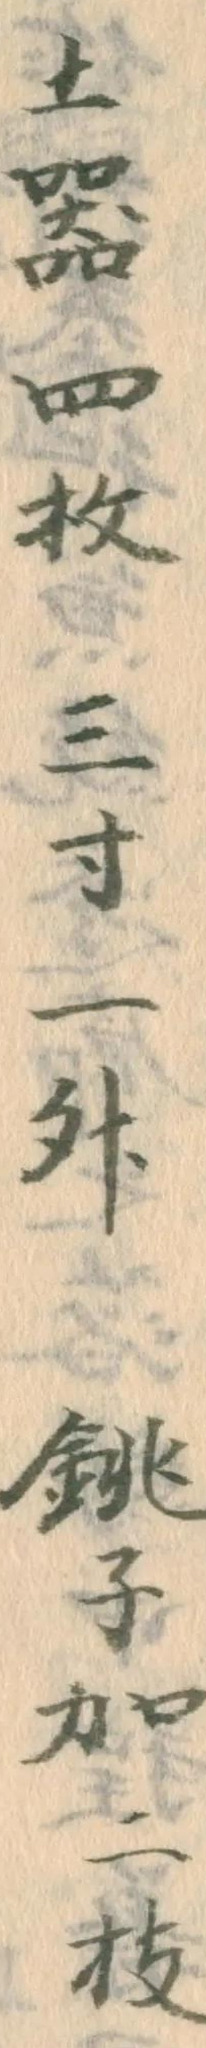土器四枚三寸一升銚子加二枝
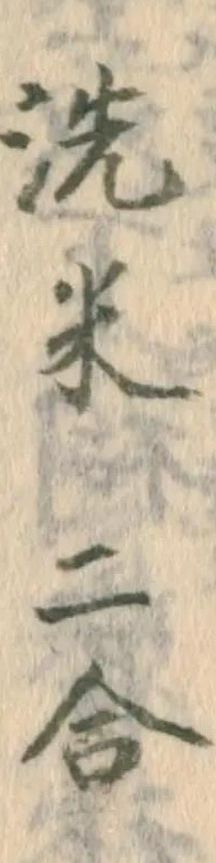洗米二合
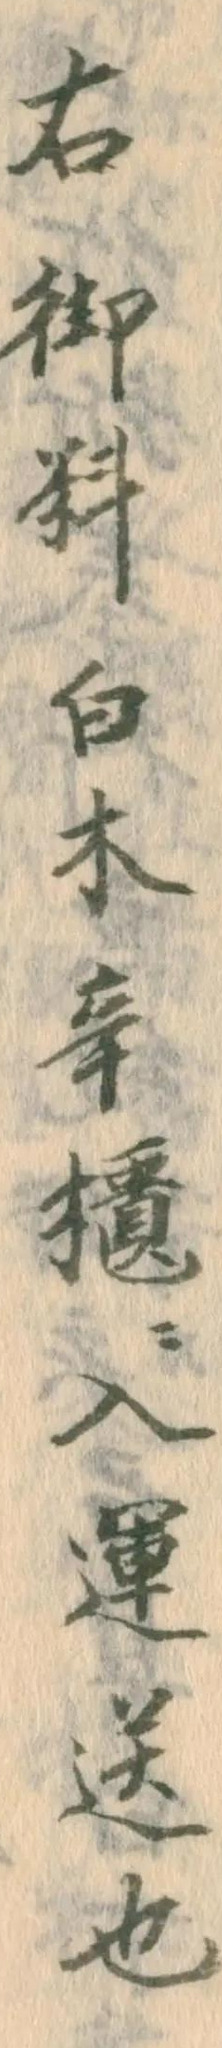右御料白木辛櫃ニ入運送也
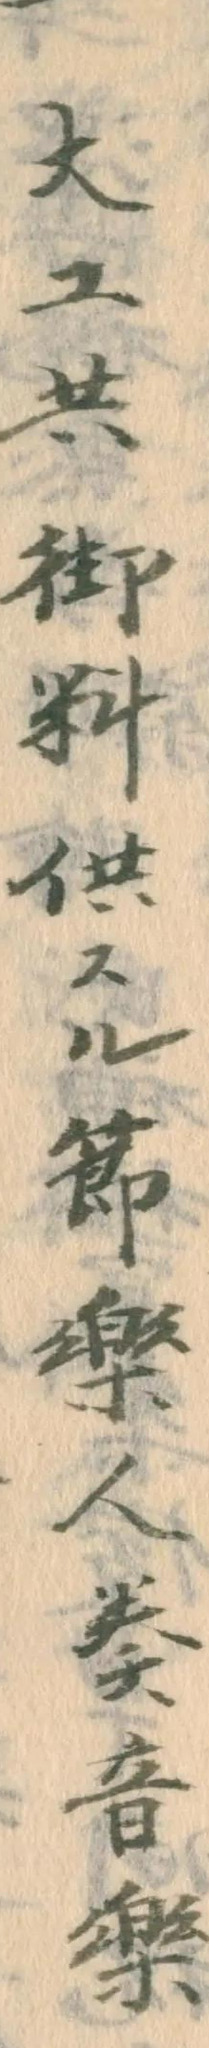一大工共御料供スル節楽人奏音楽
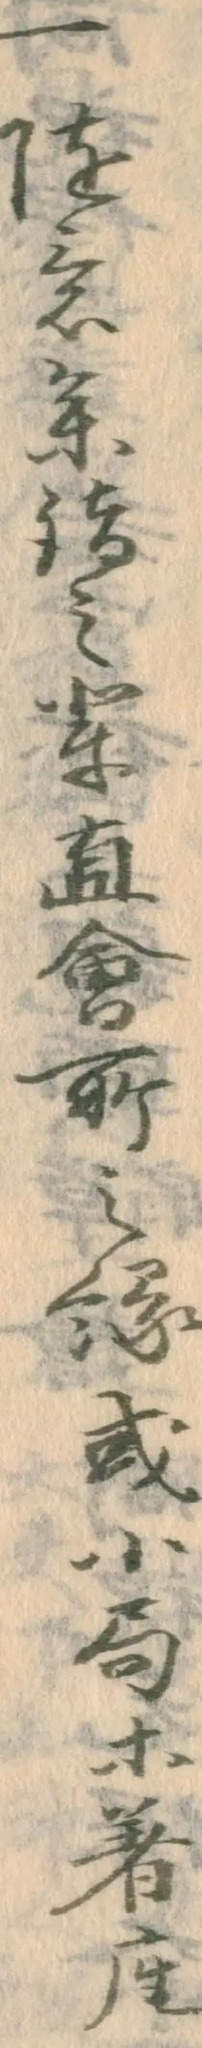一随意参詣之輩直会所之縁或小局等着座
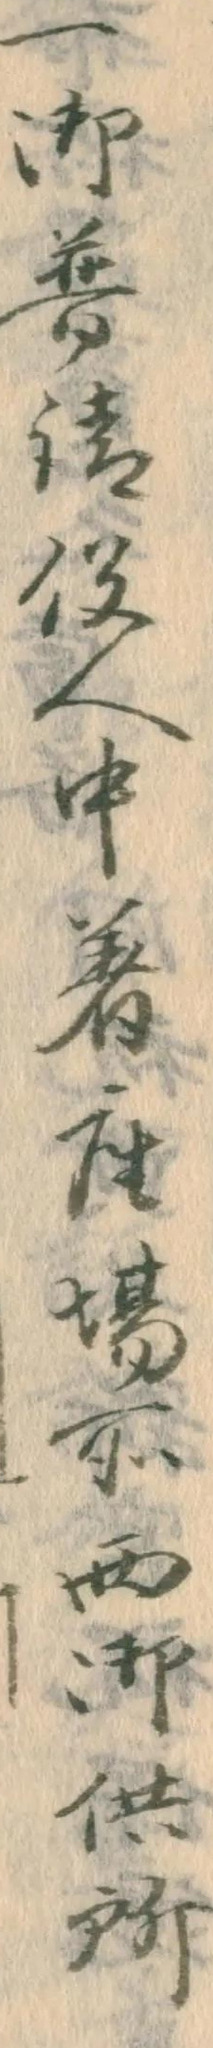一御普請役人中着座場所西御供所
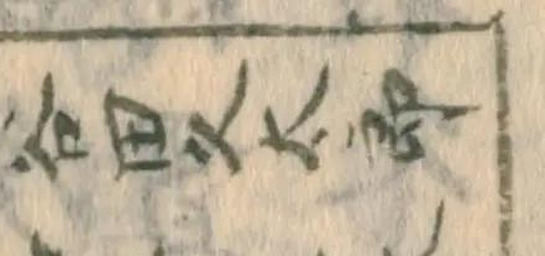谷田久太郎
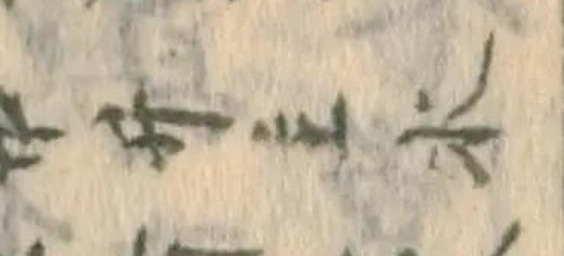中井主水
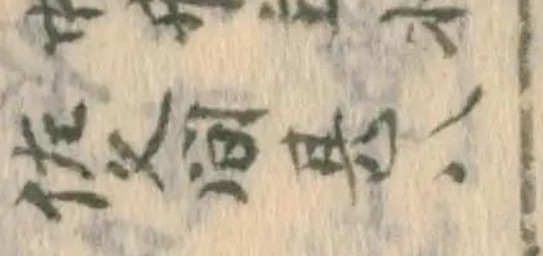佐久間甚八
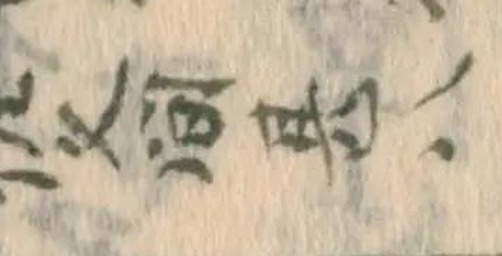佐久間甚八
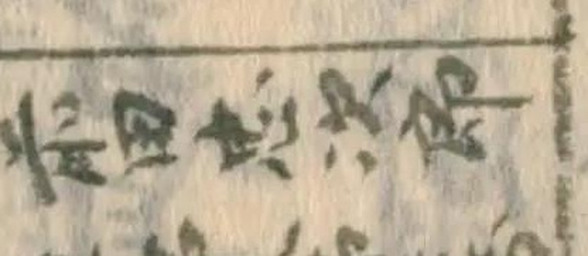前田忠治郎
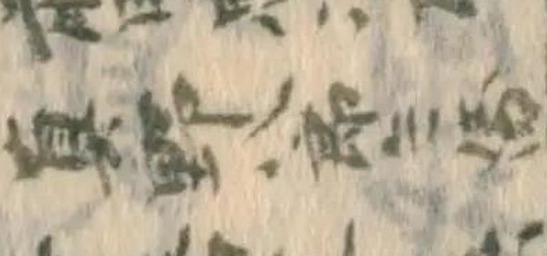真野八郎兵衛
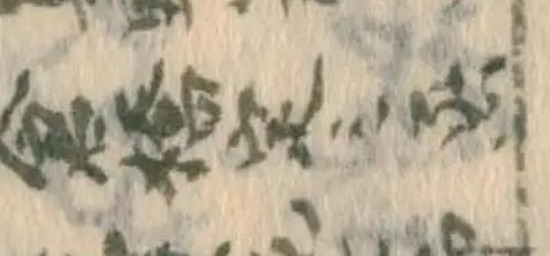倉橋定之丞
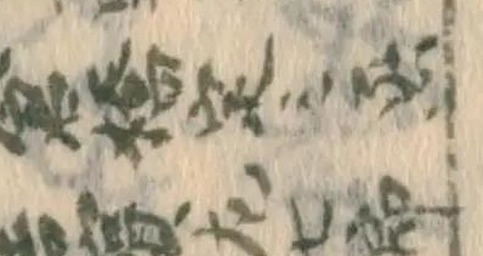倉橋定之丞
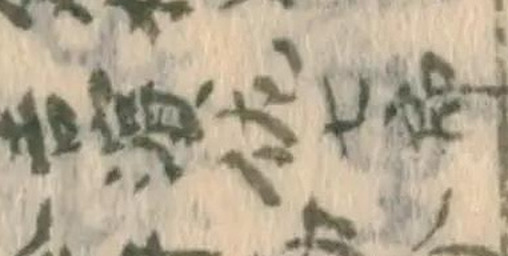吉浜佐七郎
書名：賀茂社記録. 第17冊
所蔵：国立国会図書館 National Diet Library, JAPAN
